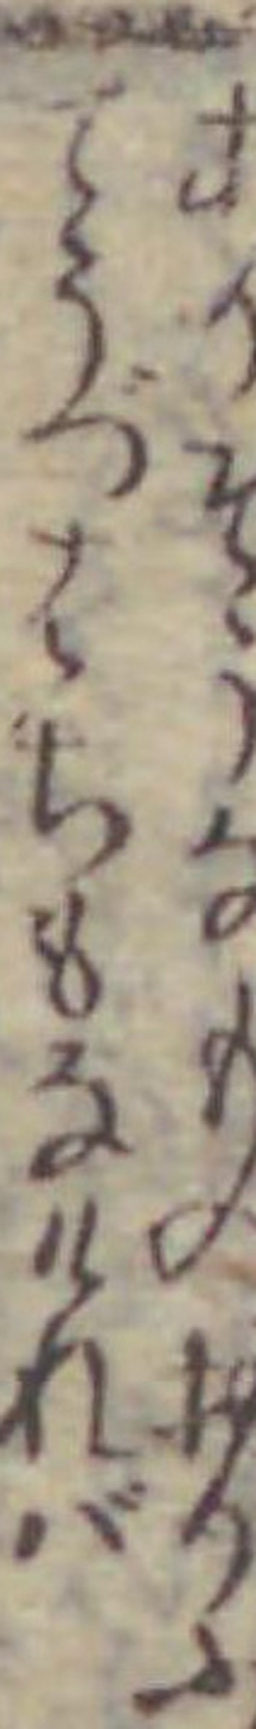てうづはちもなければ
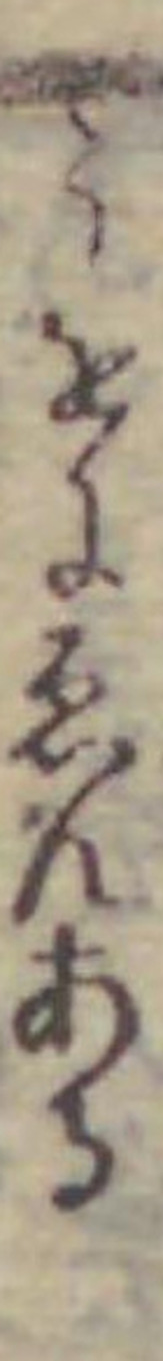うをにゑんある
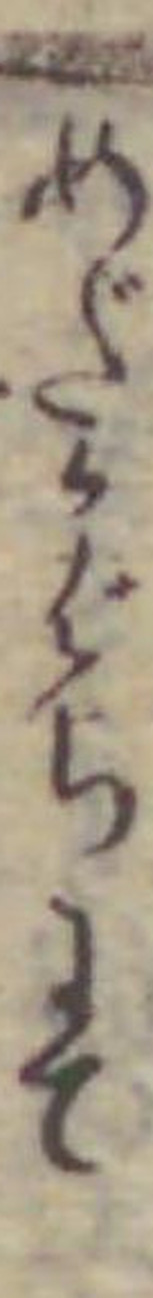めだかばちにて
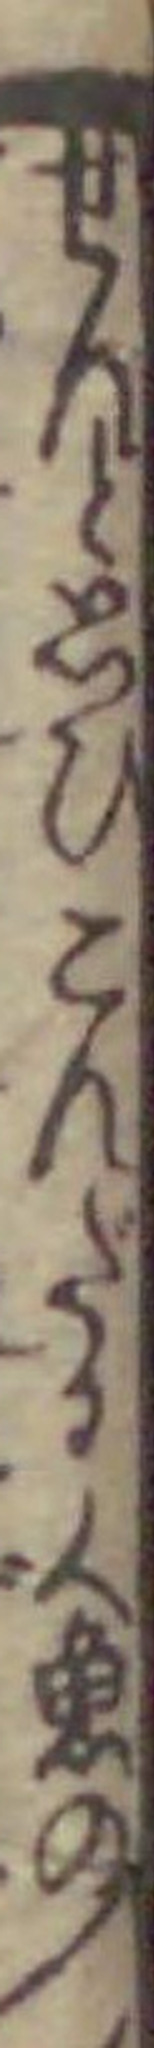せんと思ひこんだる人魚の
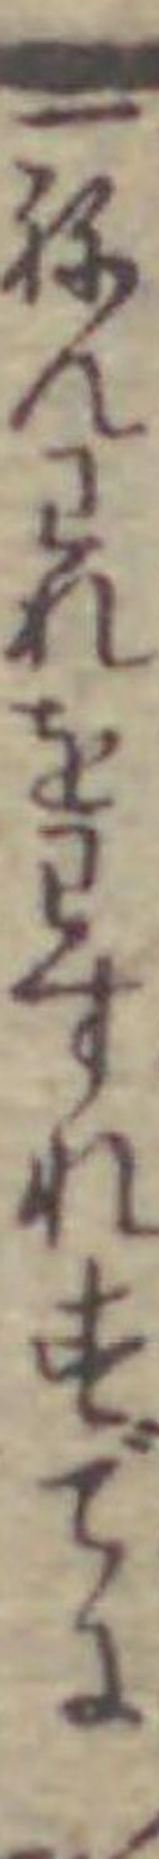一ねんわれをわすれすでに
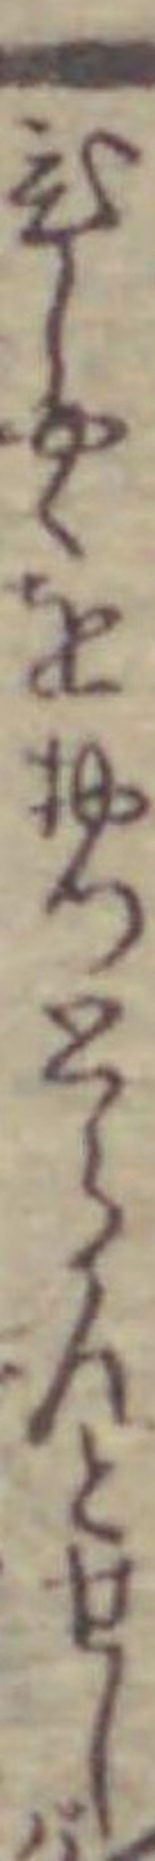ひしやくをおつとらんとせしが
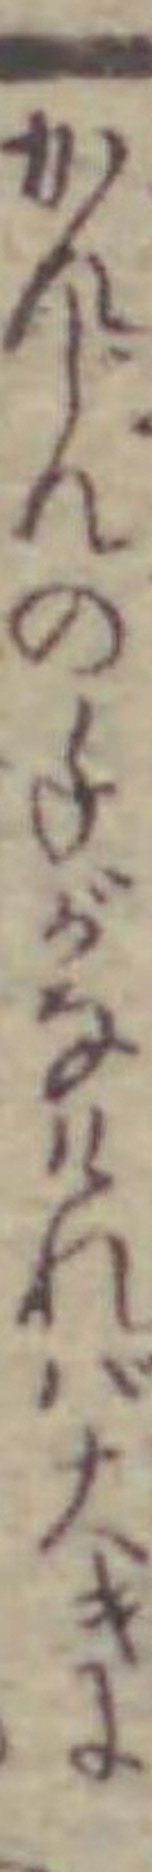かんじんの手がなければ大きに
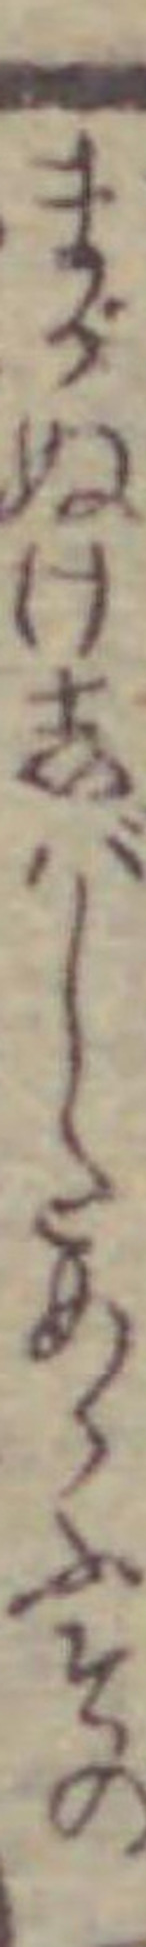まがぬけしばしためらふその
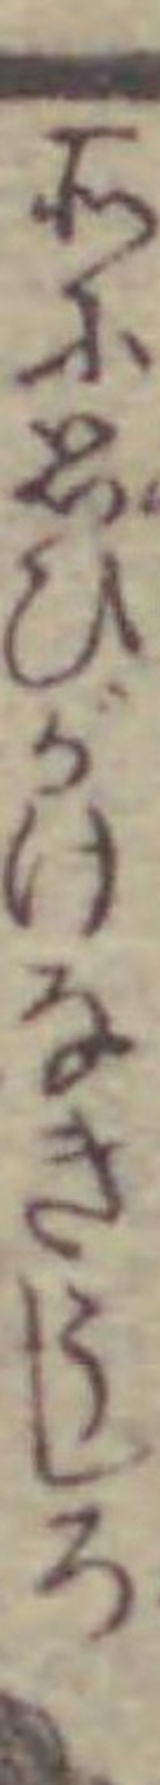所に思ひがけなきうしろ
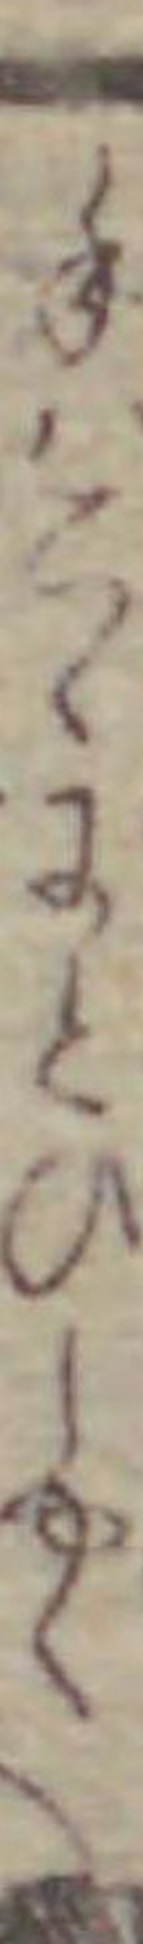手はこゝにとひしやく
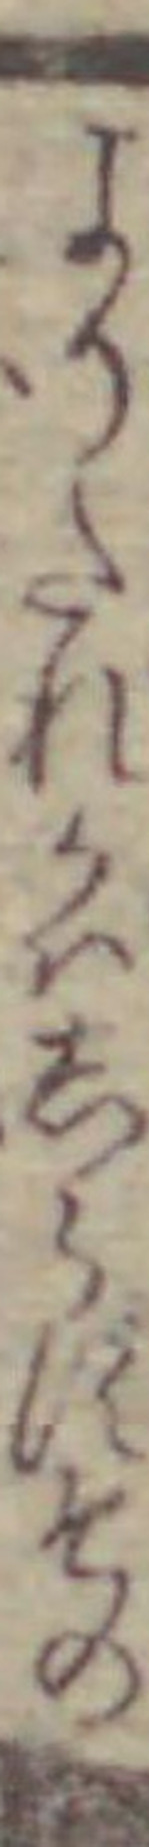よりたれかはしらずその
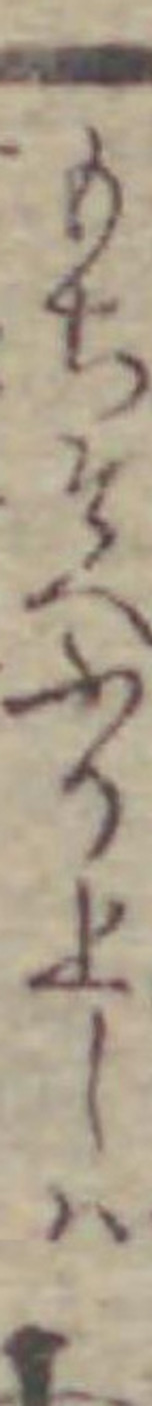もちそへふり上しは
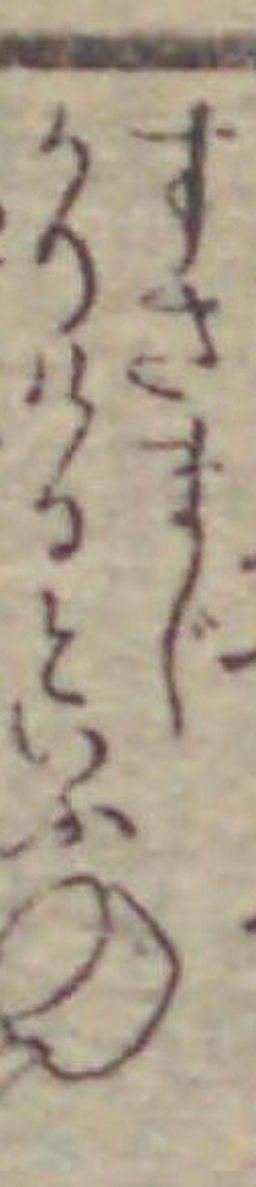かりけるといふ
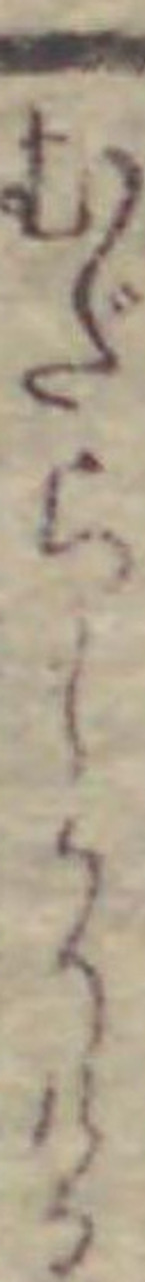むだらしかりける
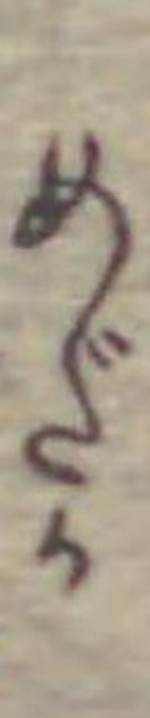めだか
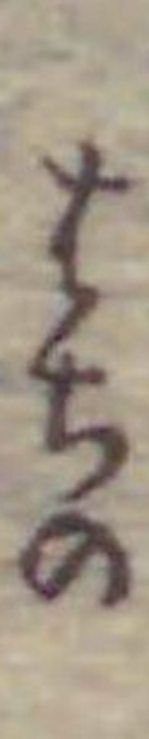はちの
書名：箱入娘面屋人魚 3巻
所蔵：国立国会図書館 National Diet Library, JAPAN
